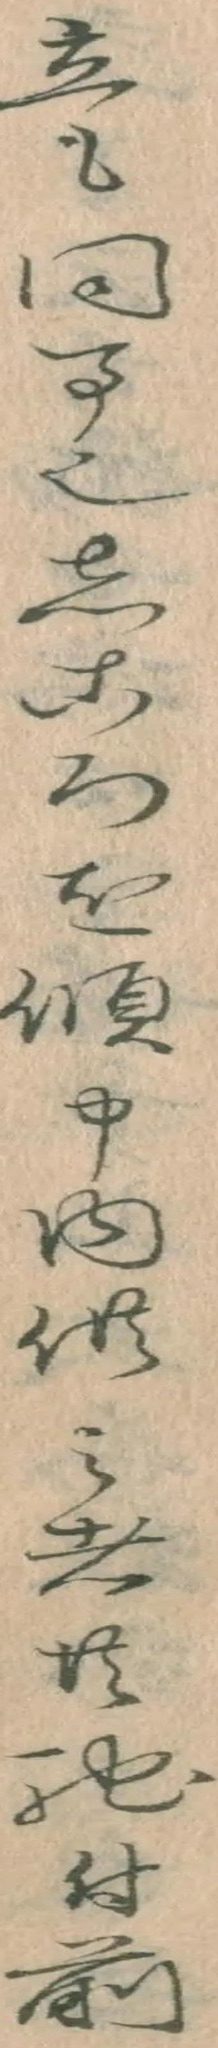立も同事也志古ろを傾申内供之者共馳付前
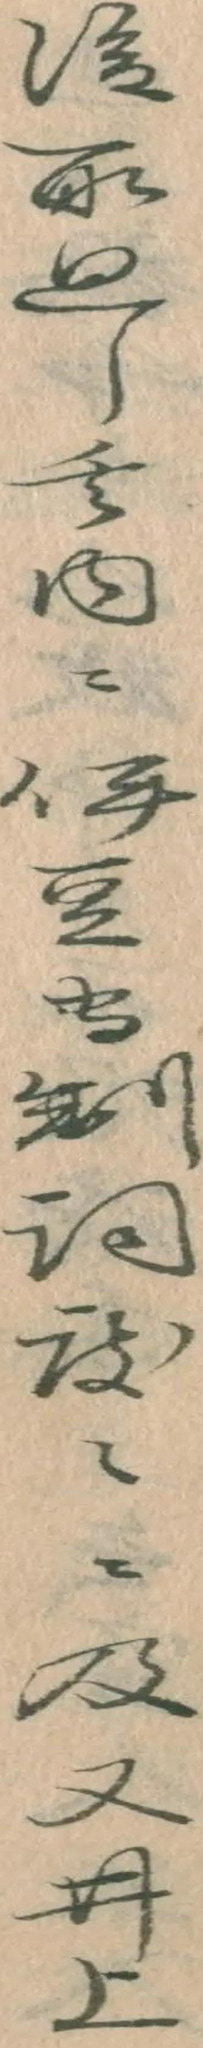後取廻し其内に伊豆守制詞度々に及又井上
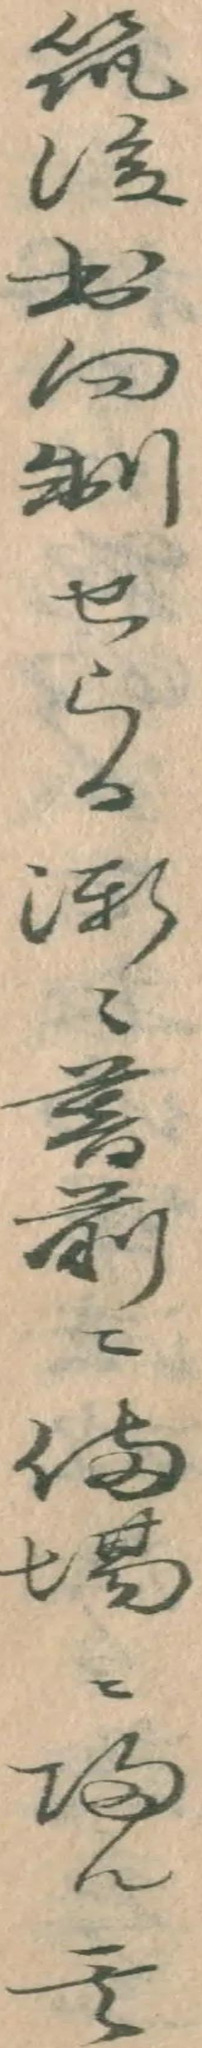筑後出向制せらる漸々暮前に備場に帰る其
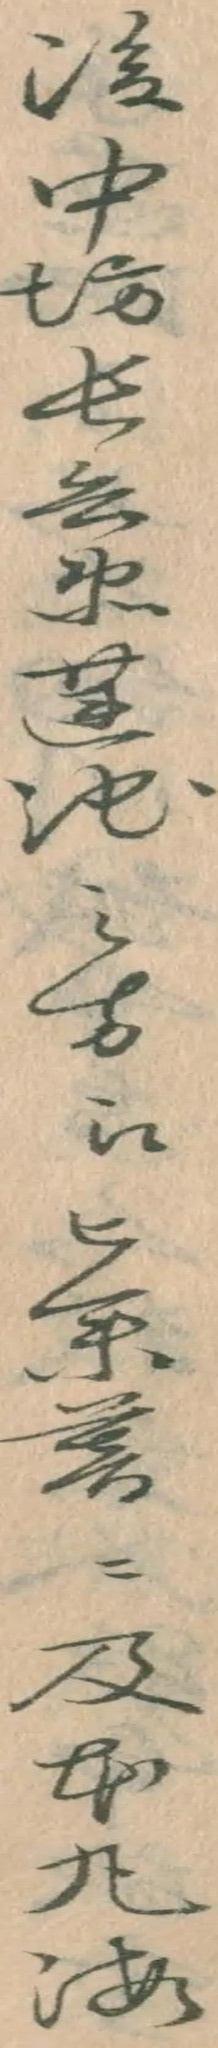後中坊長兵衛蓮池之方江被参暮に及本丸海

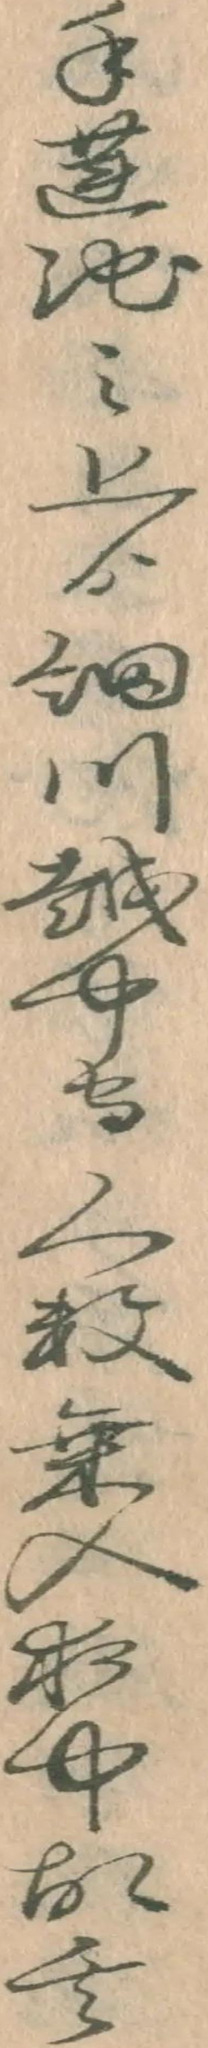手蓮池之上ゟ細川越中守人数乗入夜中故其
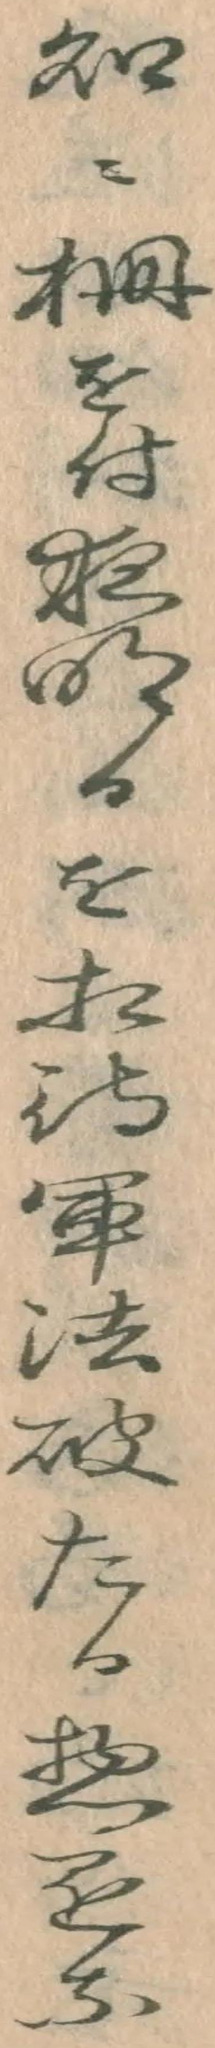処に柵を付夜明るを相待軍法破たる惣懸な
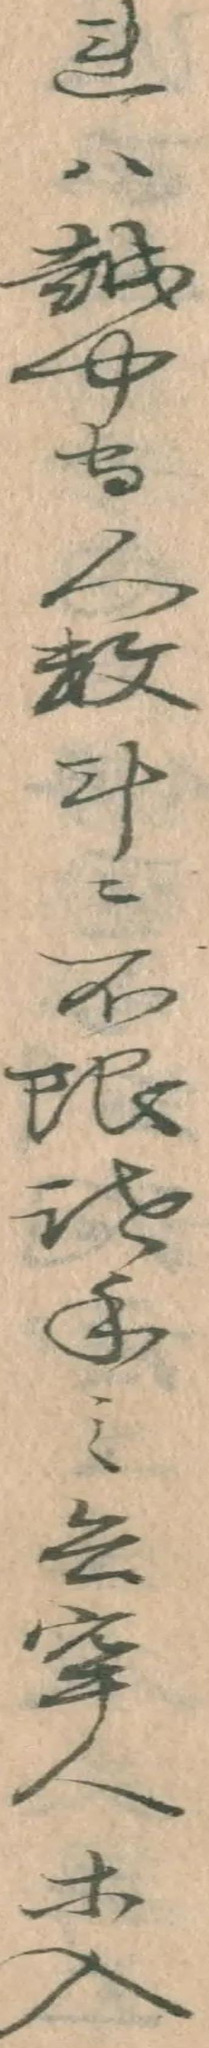連は越中守人数斗に不限諸手之兵牢人等入
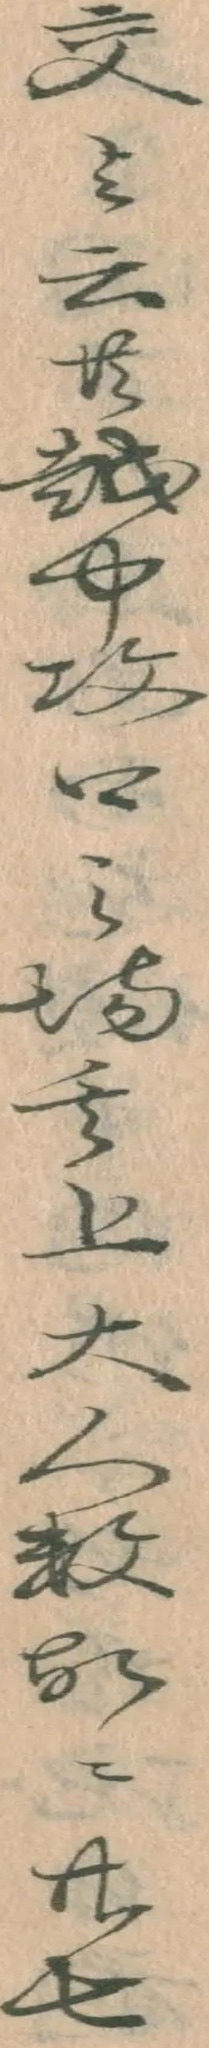交与云共越中攻口之場其上大人数故に廿七
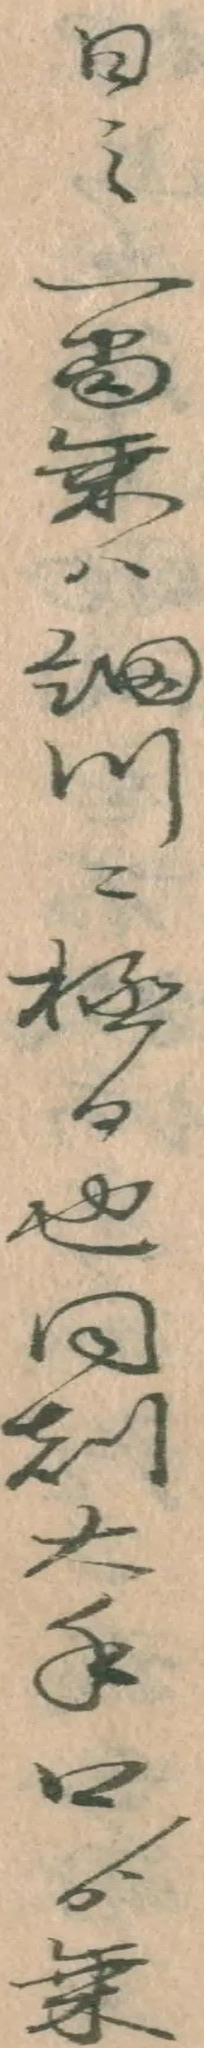日之一番乗は細川に極る也同刻大手口ゟ乗
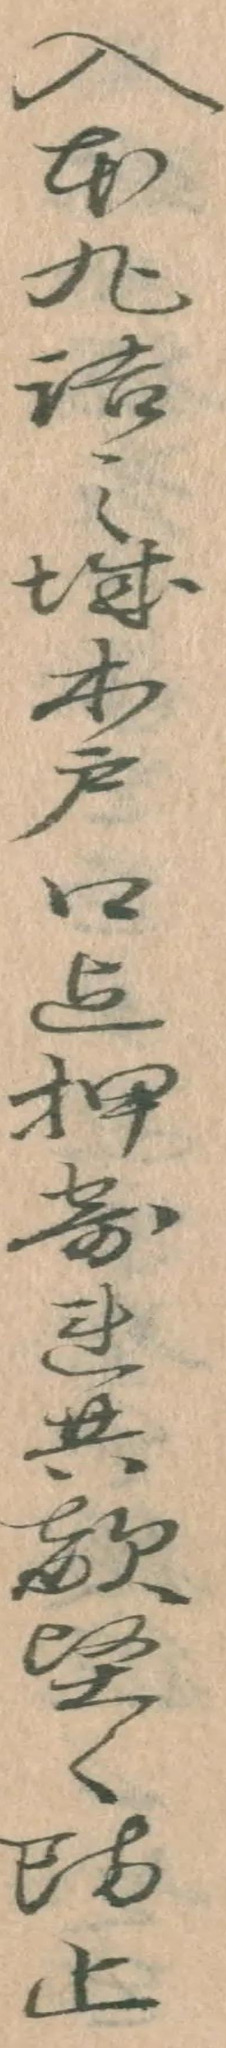入本丸詰之城木戸口迄押寄連共敵堅く防止
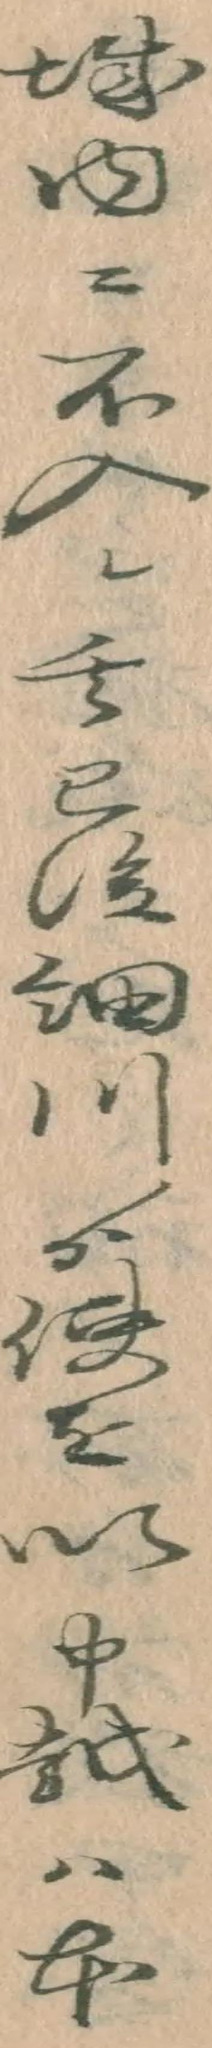城内に不入れ其已後細川ゟ使を以申越は本
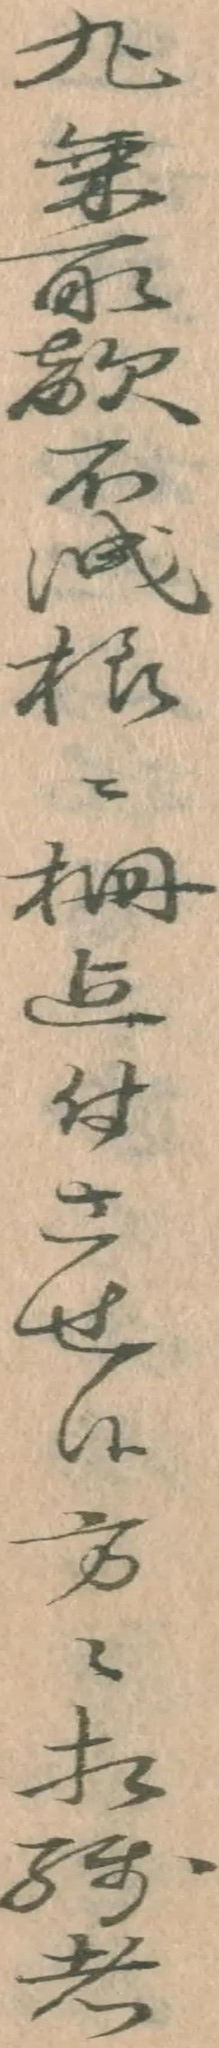丸乗取敵不洩様に柵迄付させ候方に相残者
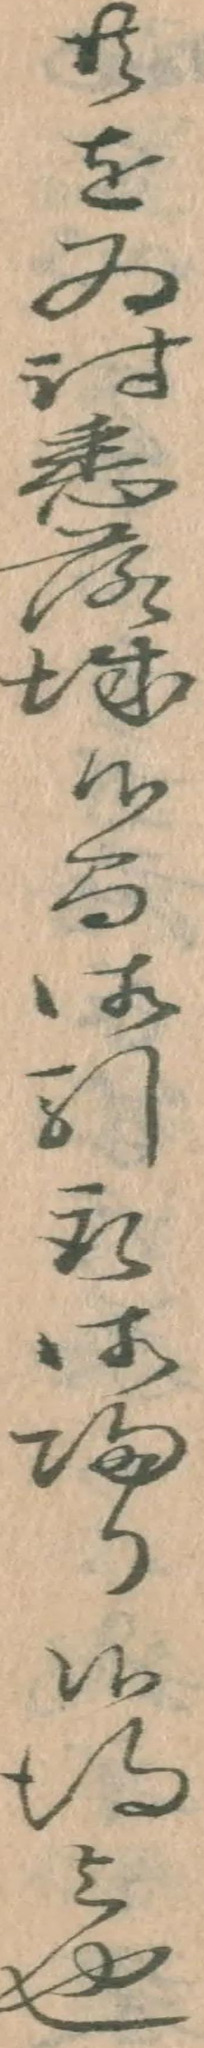共をゐ討悉落城候間御引取御帰り候得与也
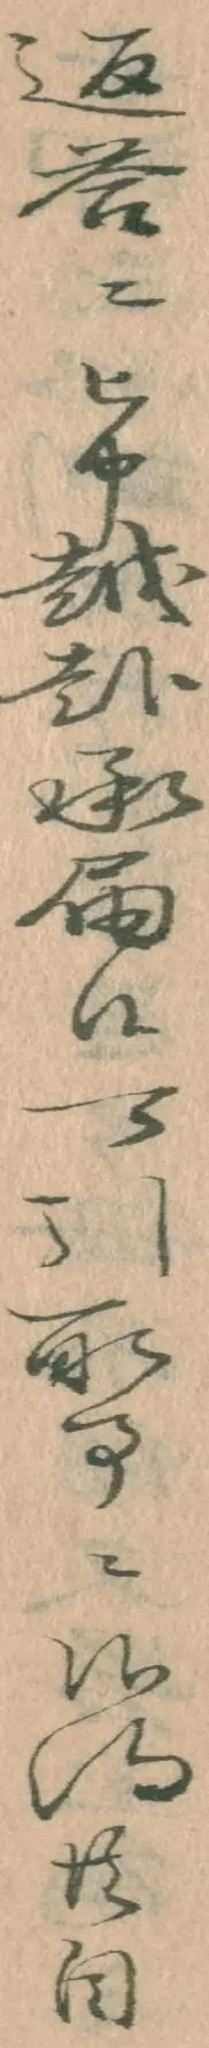返答に被申越赴承届候可引取事に候得共自
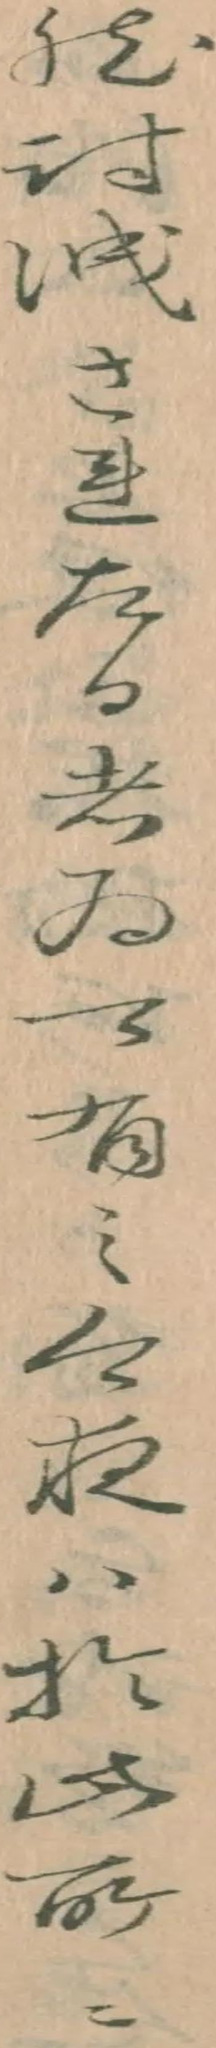然討洩さ連たる者ゐ可有之今夜は於此所に
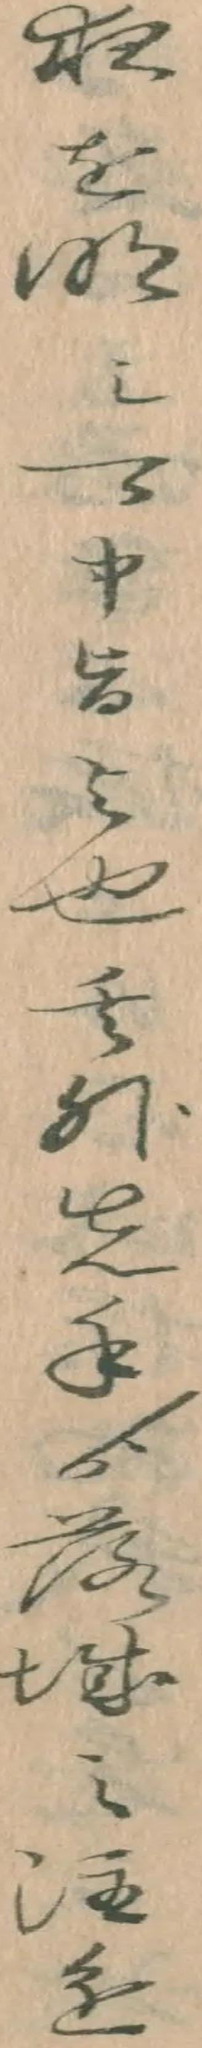夜を明し可申旨与也其外先手ゟ落城之注進
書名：切支丹御退治記 49巻. [8]
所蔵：国立国会図書館 National Diet Library, JAPAN
